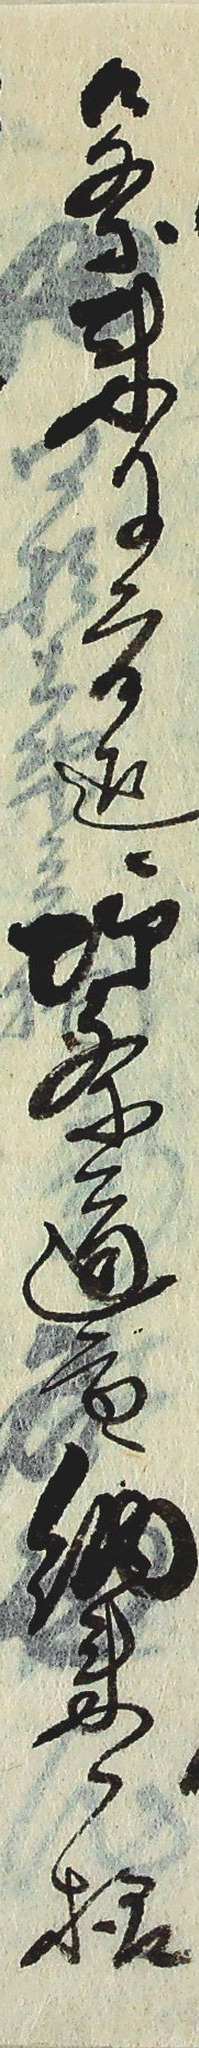候条来月二日迄に御茶道方へ納来候様
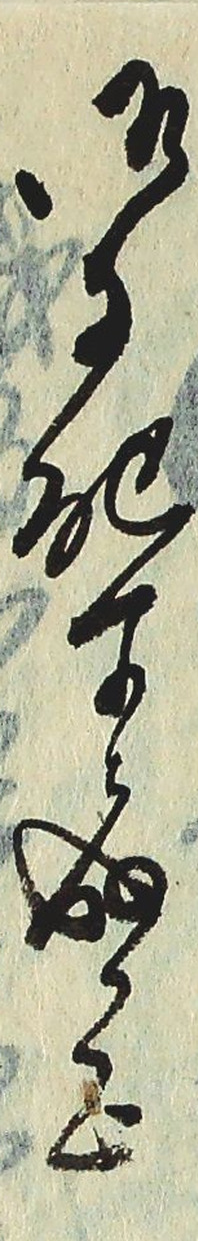御手配可被成候以上
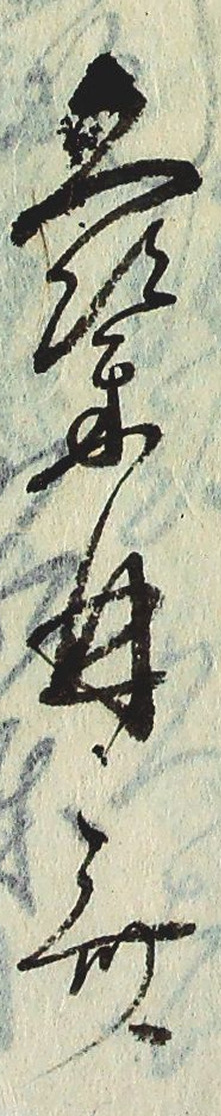久次米林斎
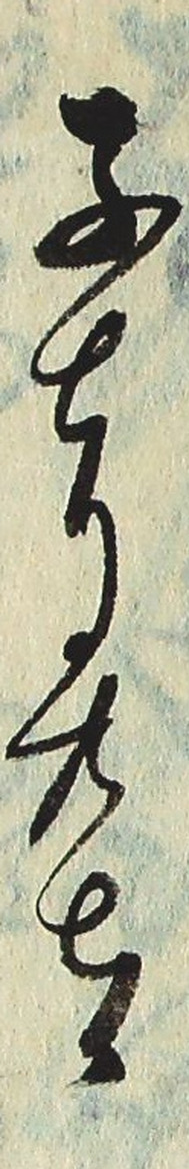子七月四日
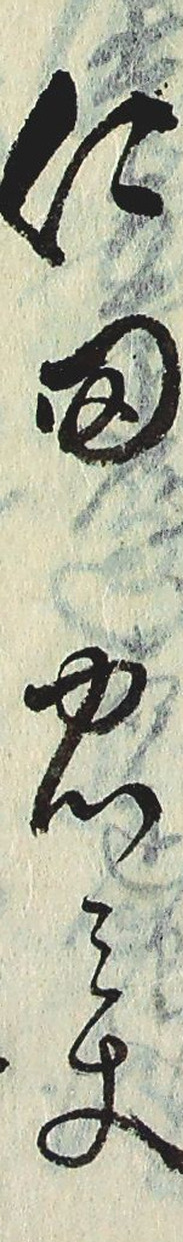仁田忠之丈
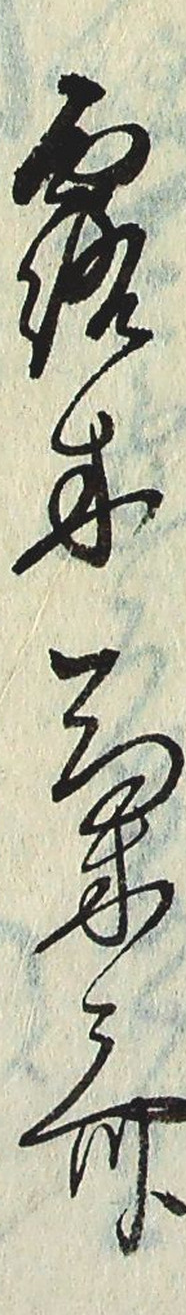露木蘭斎
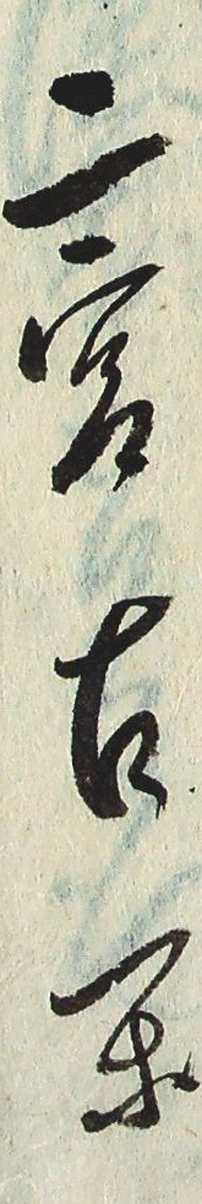二宮古閑

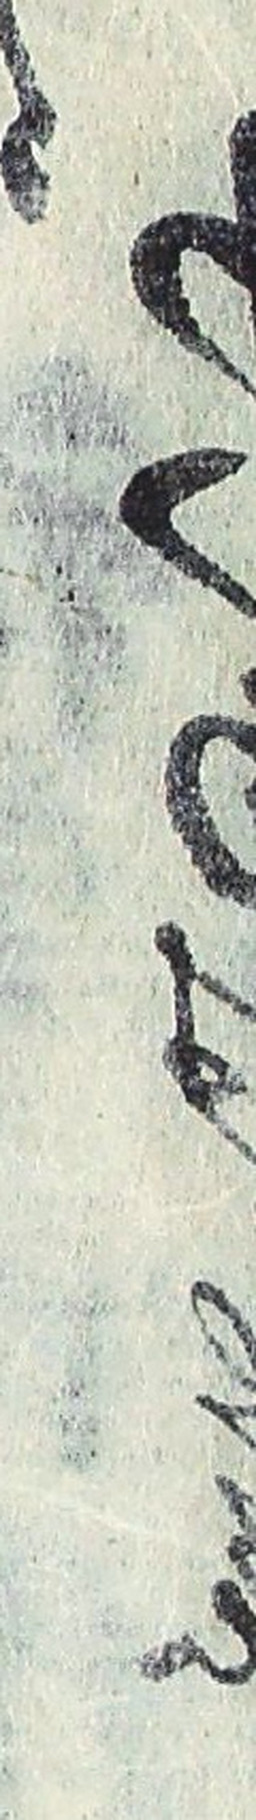十一月廿七日
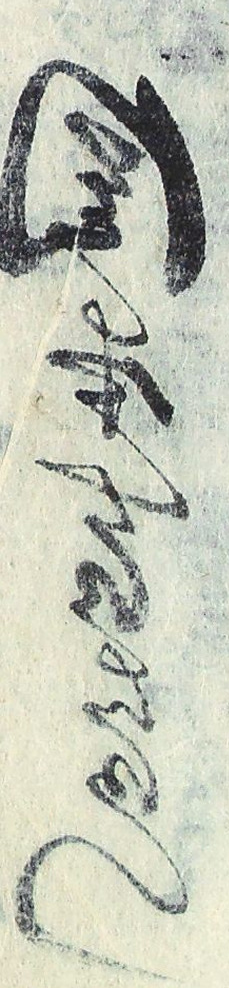十一月廿七日
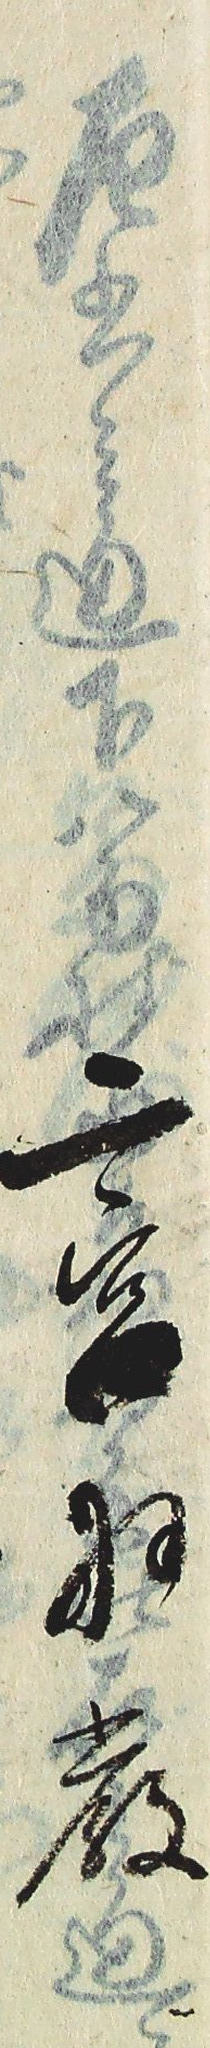二宮羽厳
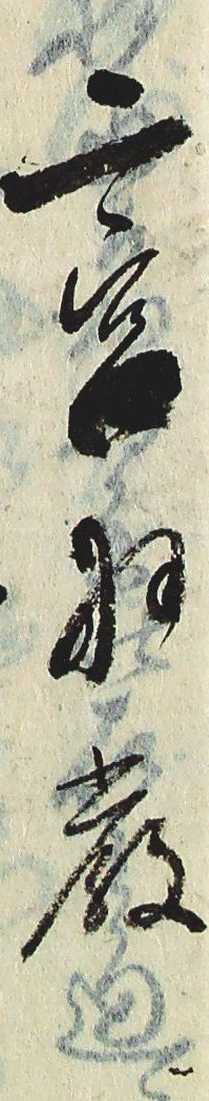二宮羽厳
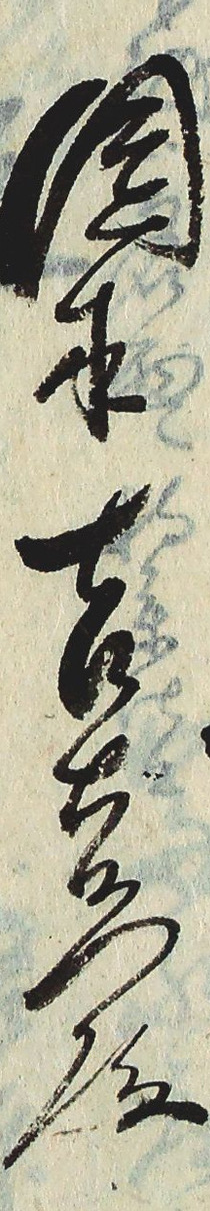岡本吉右衛門殿
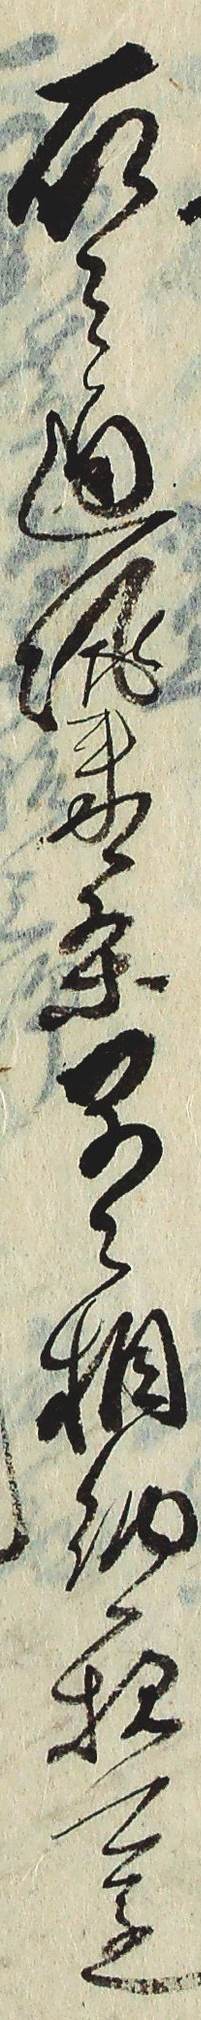右之通誂来候条早々相納候様可遂
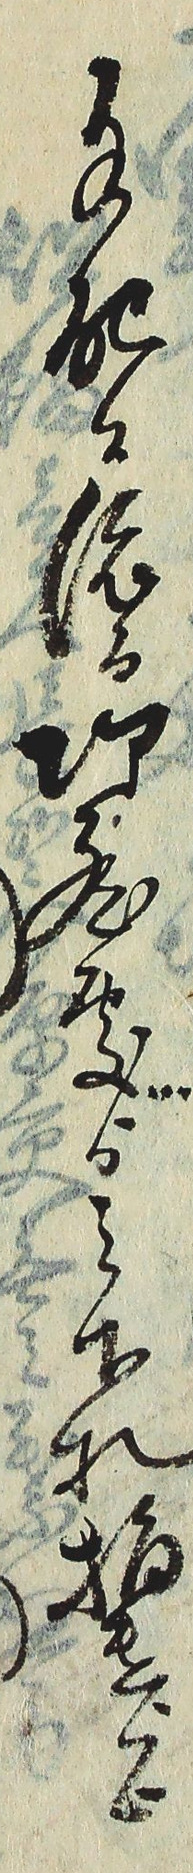手配候依て御蔵処ゟ之下札指遣候以上
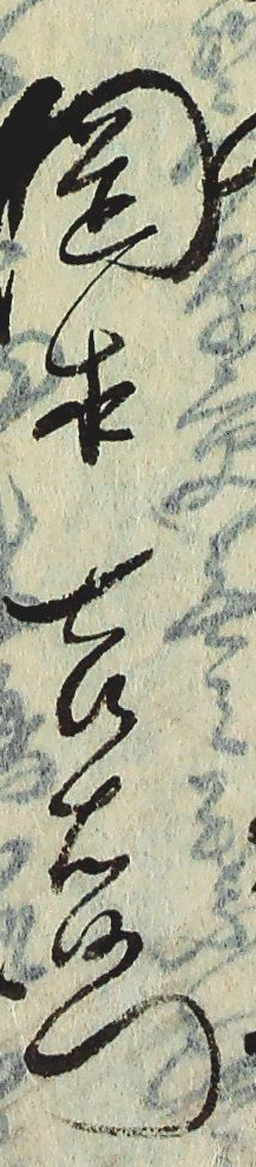岡本吉右衛門
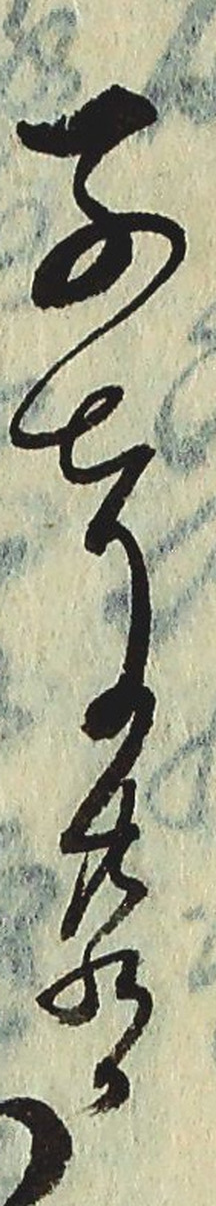子七月廿九日
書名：名東郡中諸割賦元帳
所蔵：鳴門教育大学 Naruto University of Education
